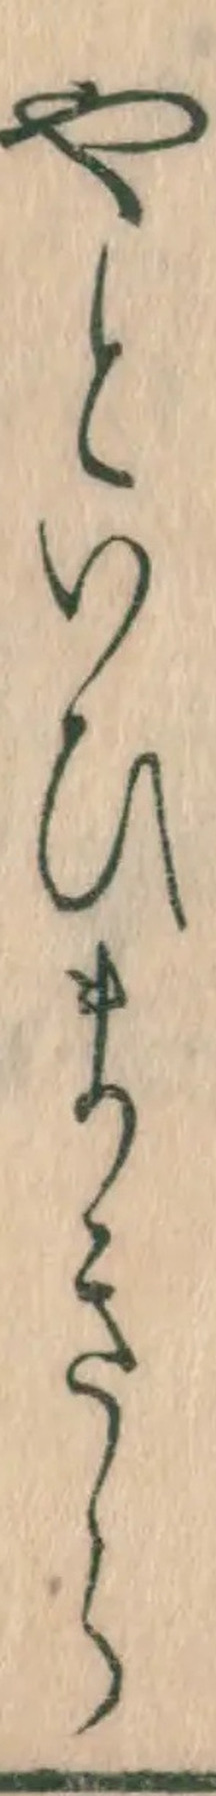やといひまきら
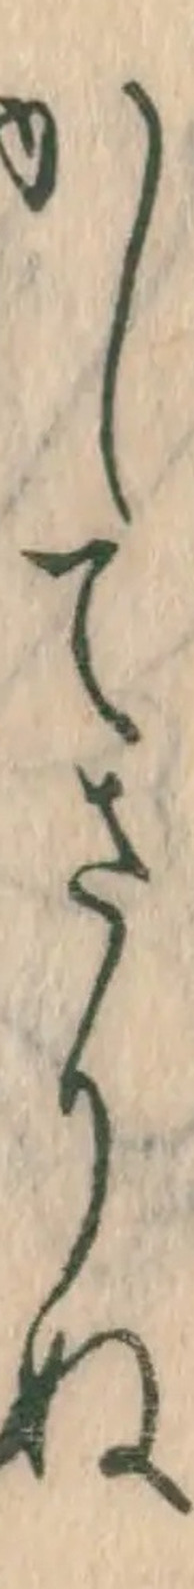かしてさりぬ

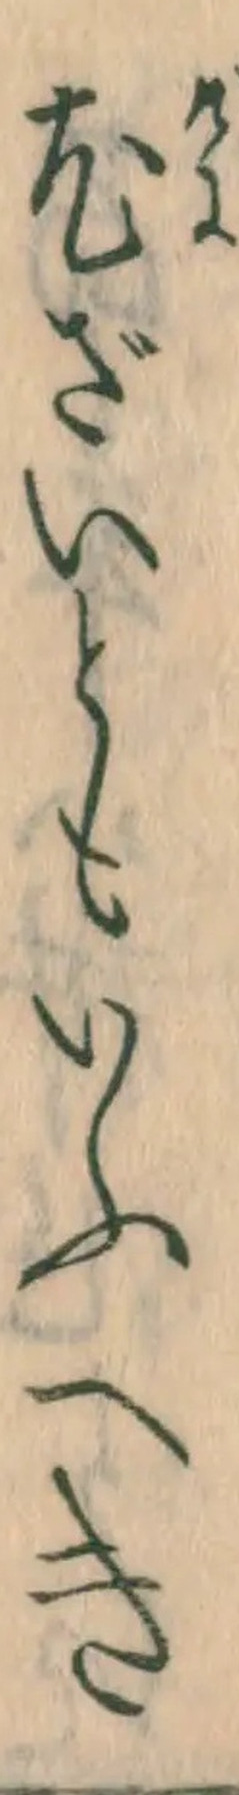尤ざいともいふへき
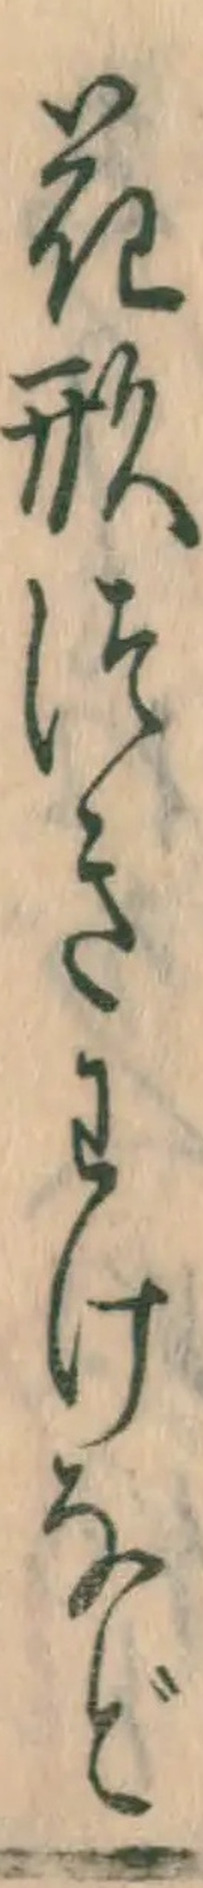花形つきわけなど
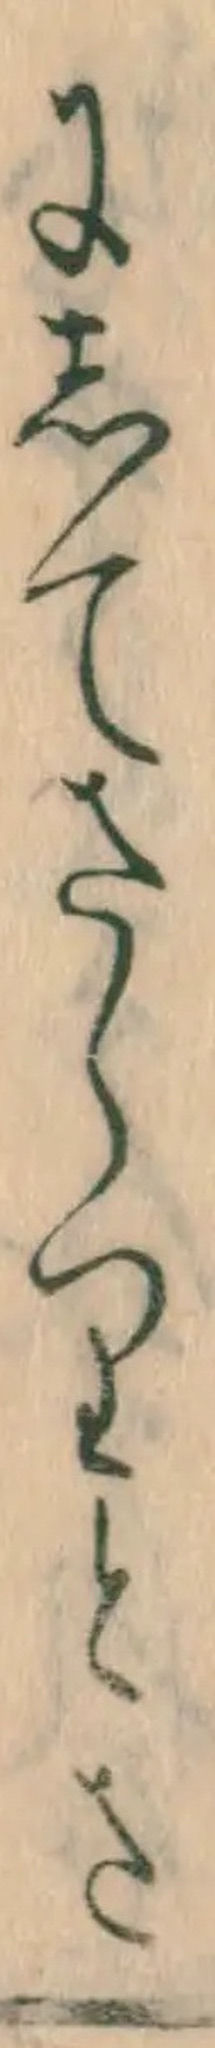にしてさらりとさ
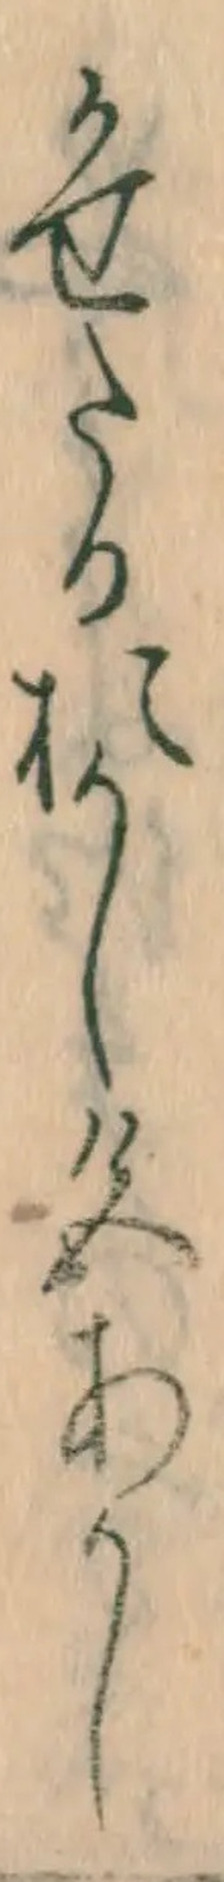かせたるおかし色あかし
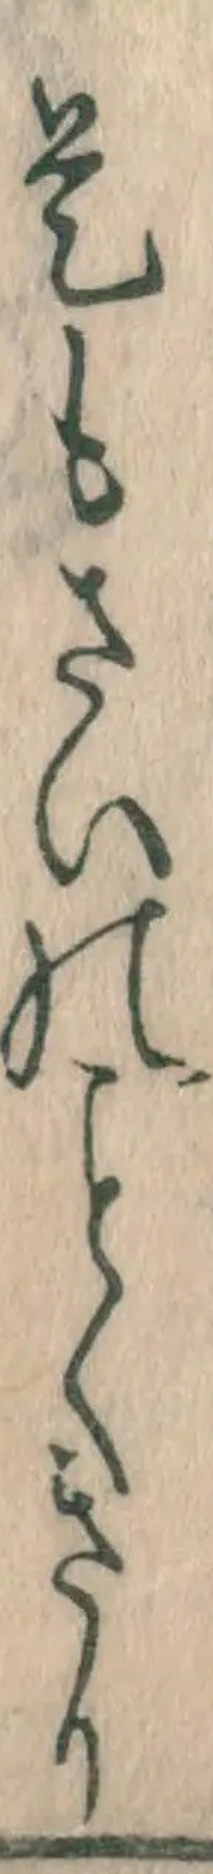是もさいのことくきり
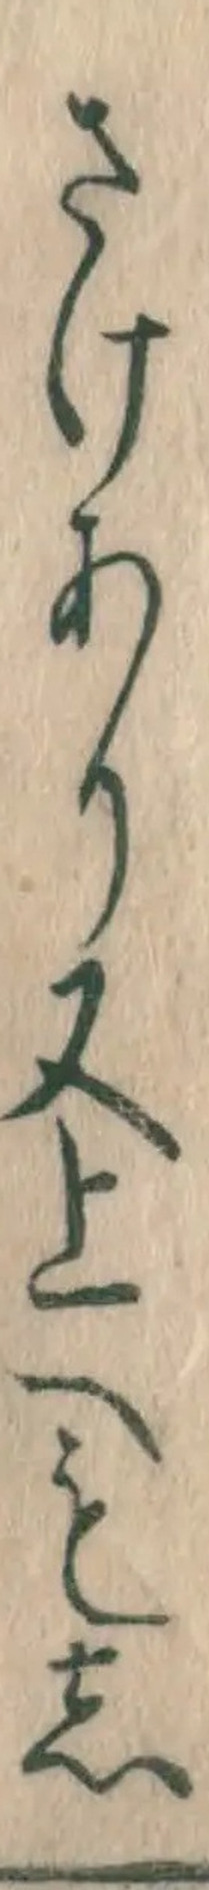さけあり又上へもし
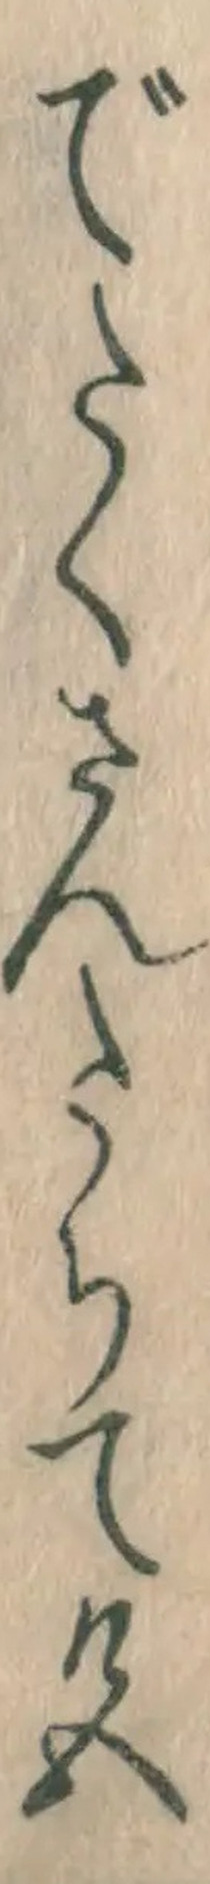でたくさんたちて色

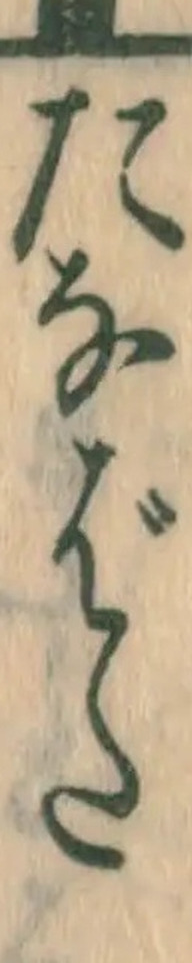たなばた
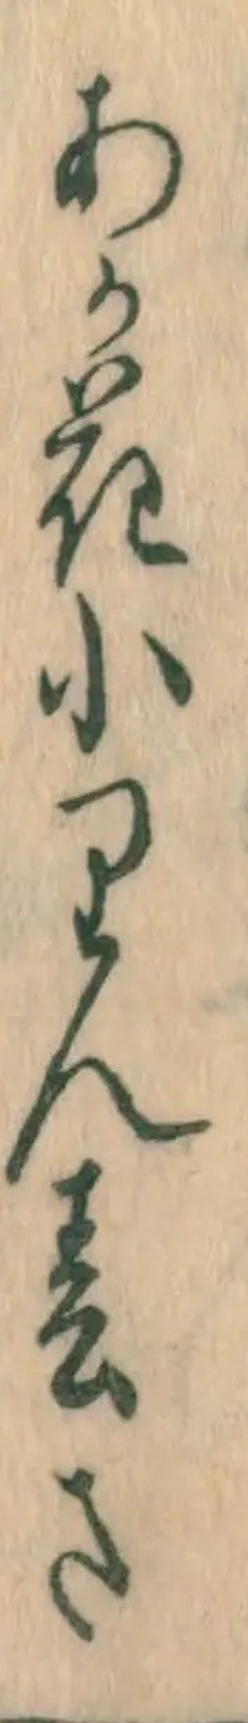あか花小りん春さ
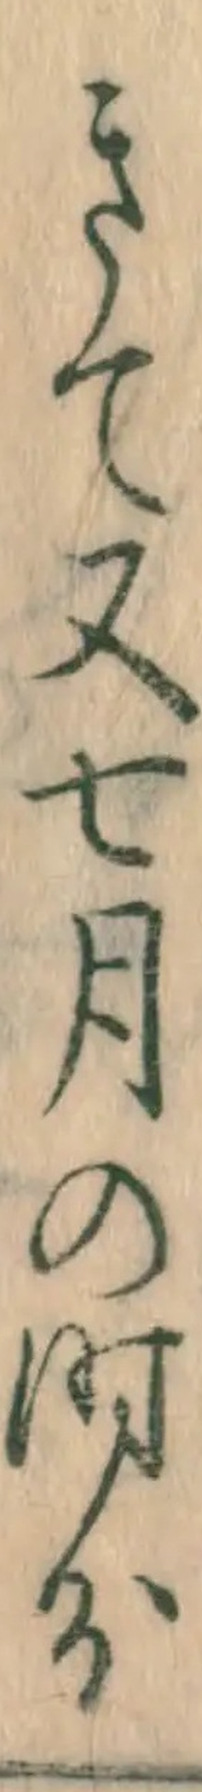きて又七月の時分
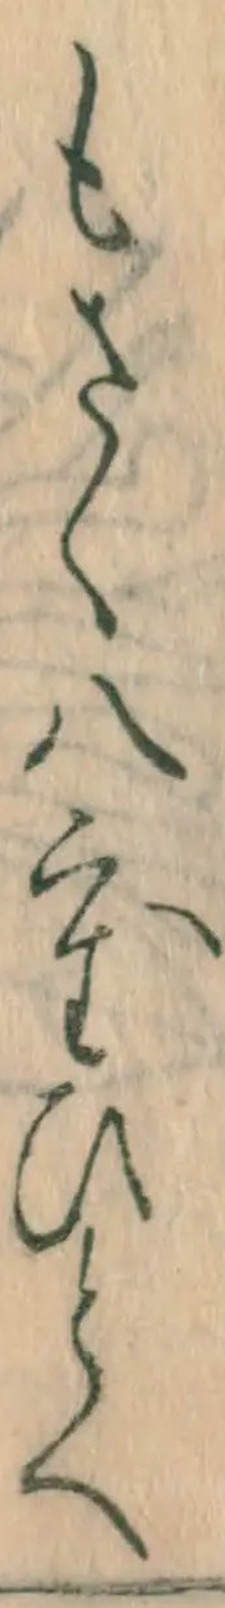もさく八重ひとへ
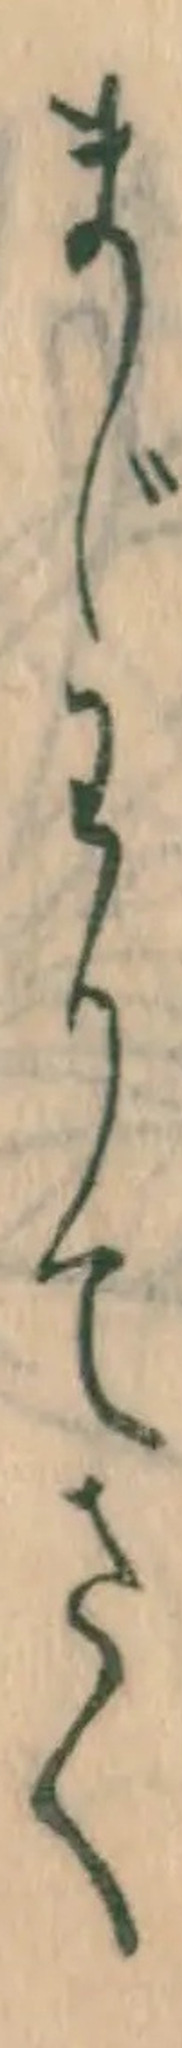まじわりてさく
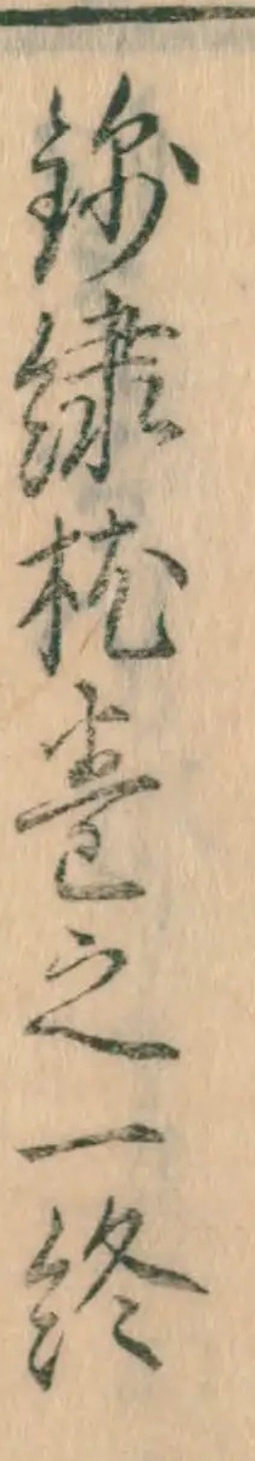錦繍枕巻之一終
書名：錦繍枕 5巻. [1]
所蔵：国立国会図書館 National Diet Library, JAPAN
